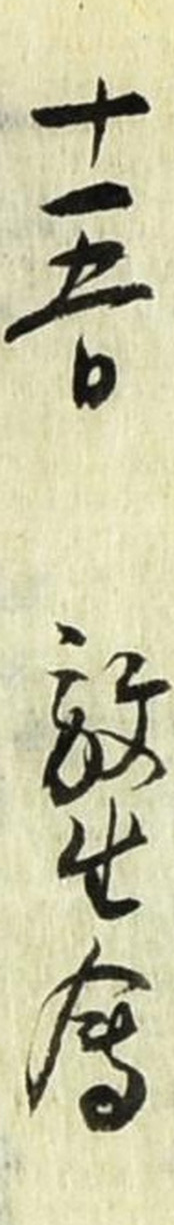十五日放生会
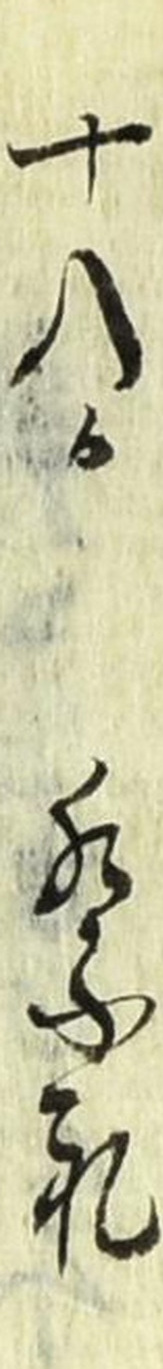十八日祭礼
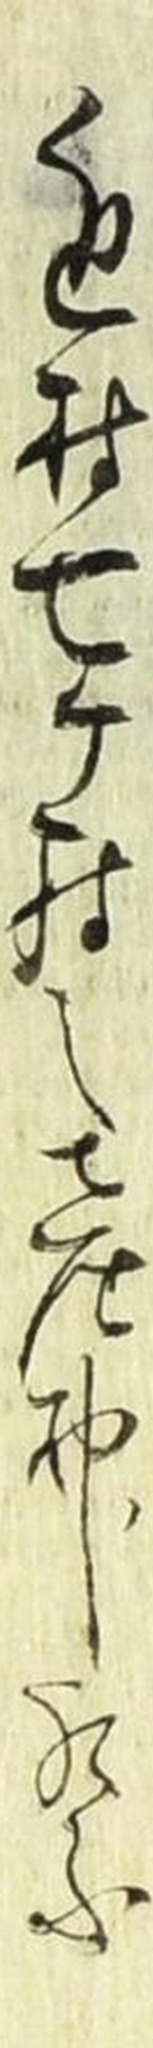近村七ヶ村之産神祭
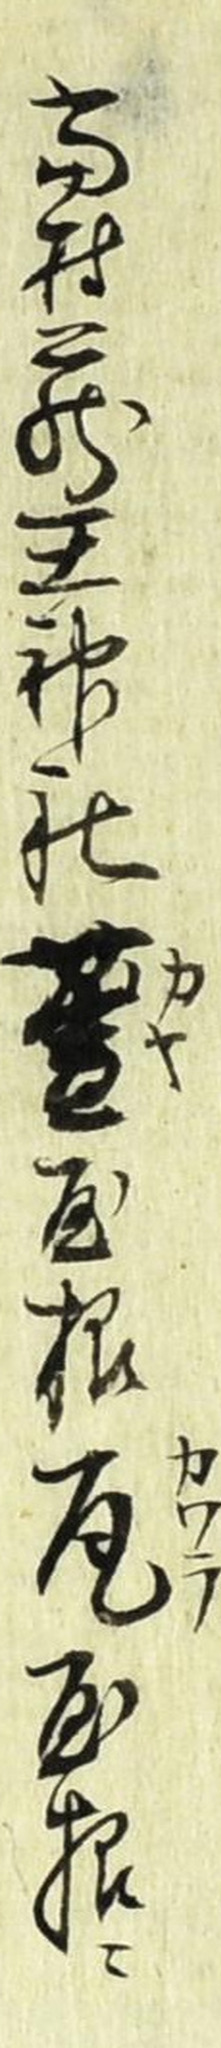当村蔵王神社萱屋根瓦屋根に
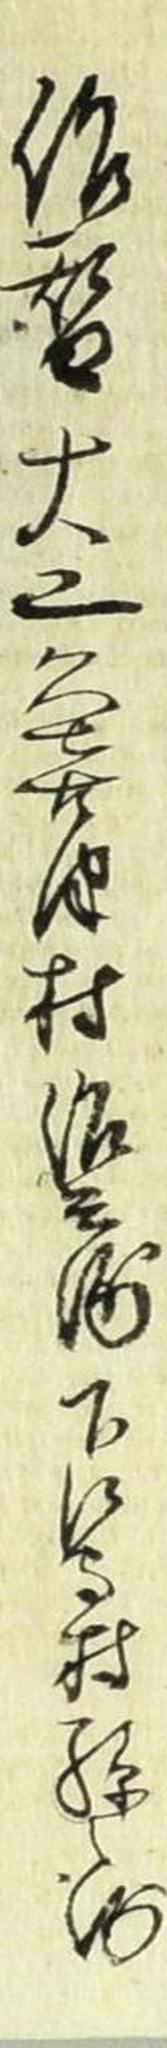作替大工久喜津村作兵衛下江守村孫兵衛
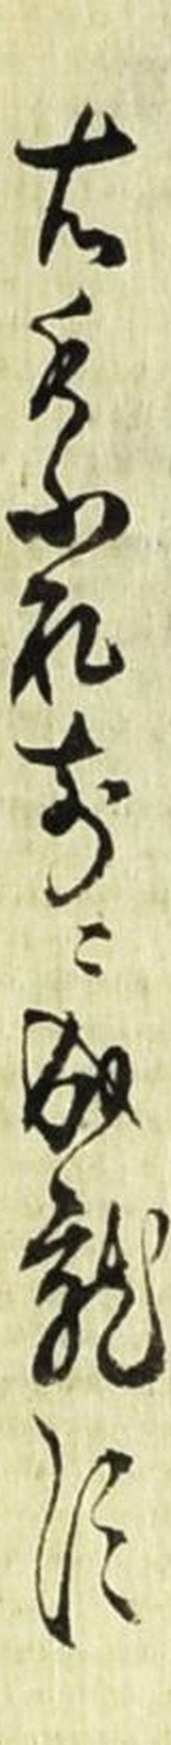右祭礼前に成就す

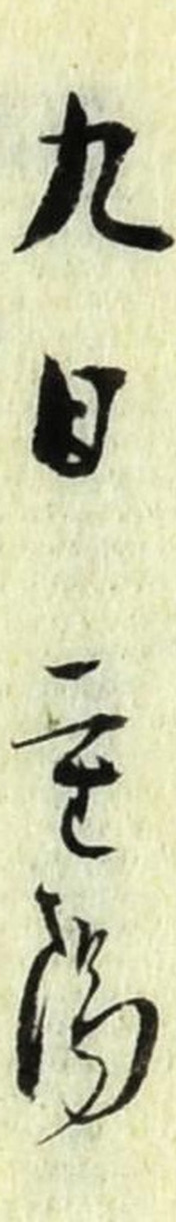九日重陽
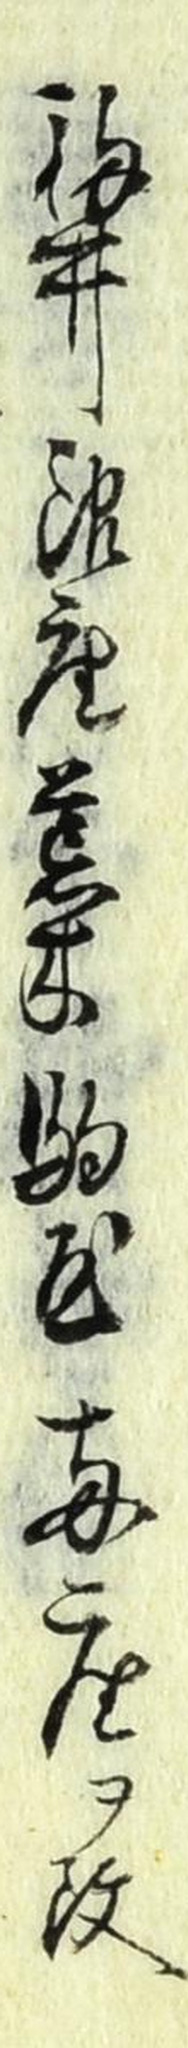福井銀座荒木駒屋両座を改
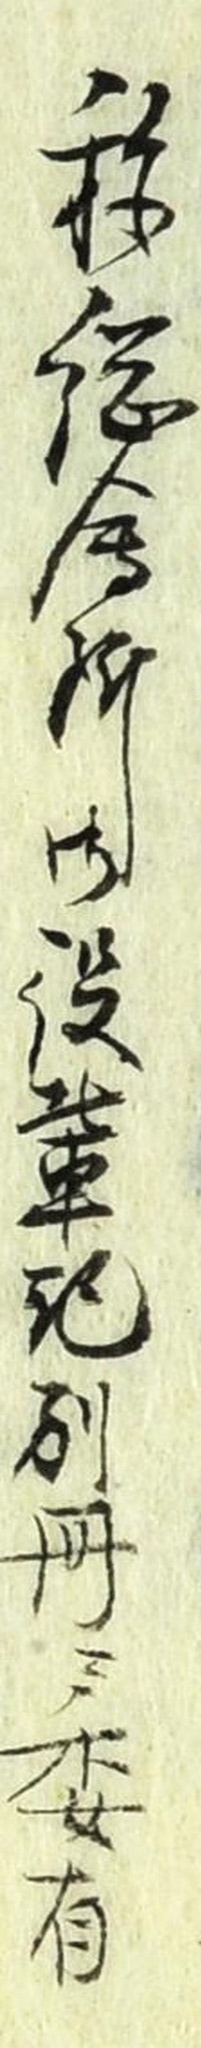祢総会所御役輩記別冊に委有
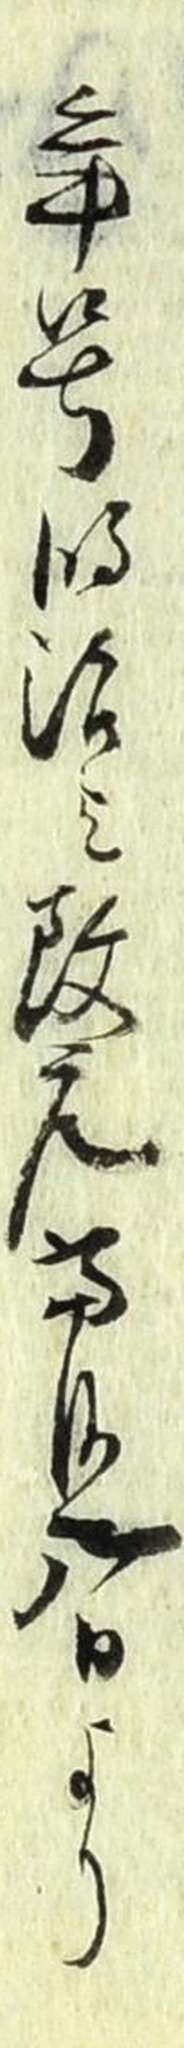年号明治と改元当月八日より
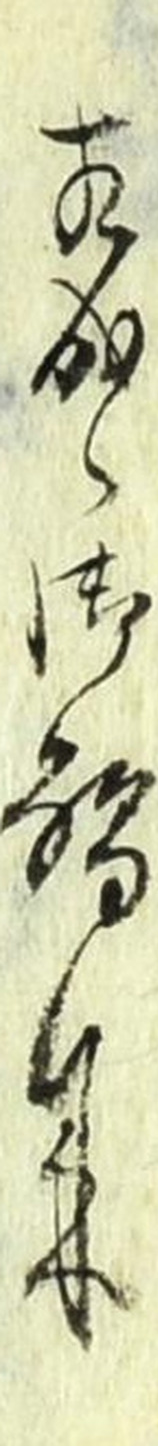相成候御触来
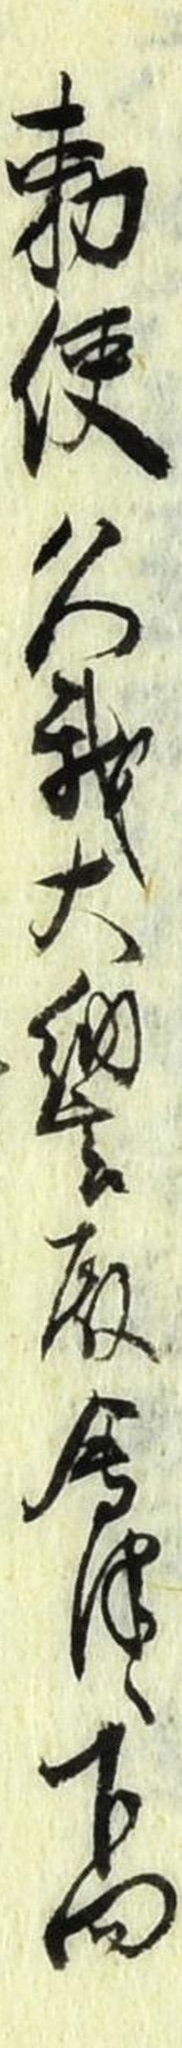勅使久我大納言殿会津へ下向
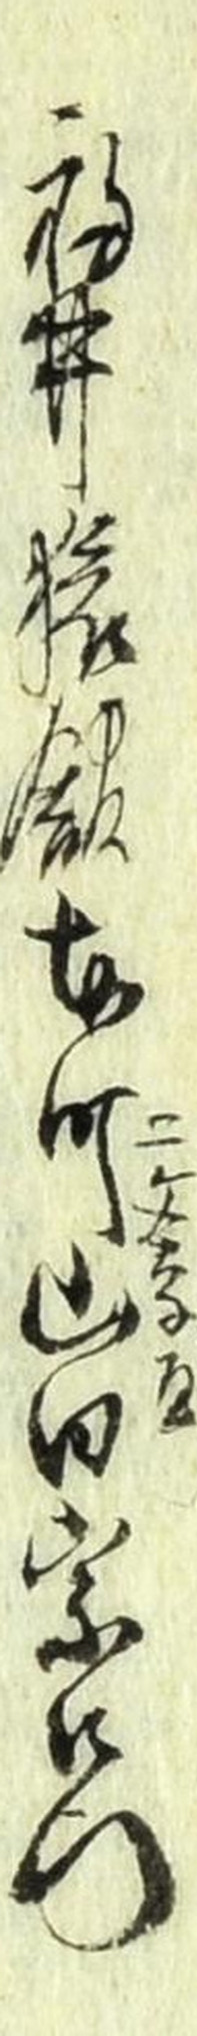福井旅舘本町山田宗左衛門
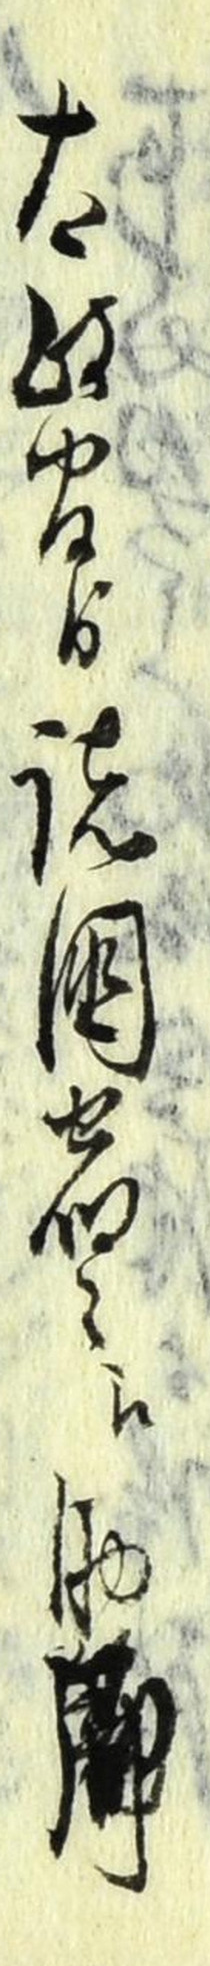太政官ゟ諸国宿々え助郷
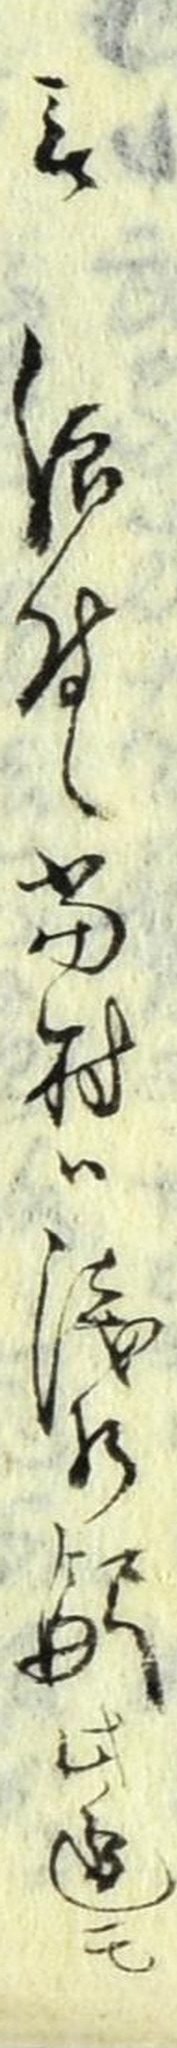被仰付候当村は浅水駅此辺も
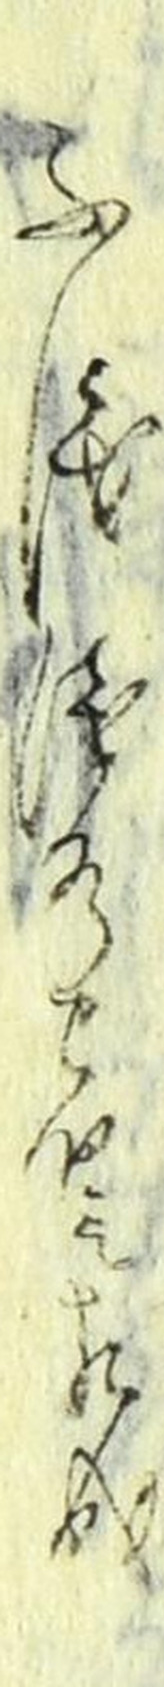不残浅水宿と相成
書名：（日記）
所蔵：福井県文書館 Fukui Prefectural Archives
